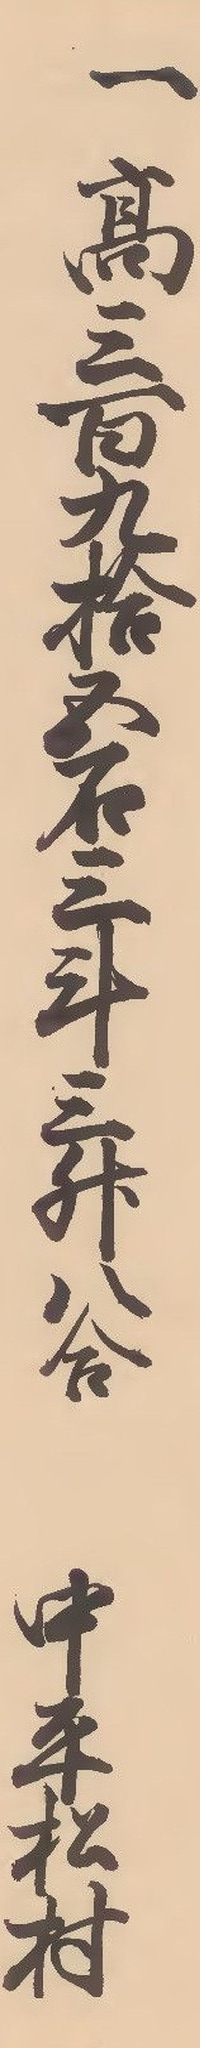一高三百九拾五石三斗三升八合中平松村
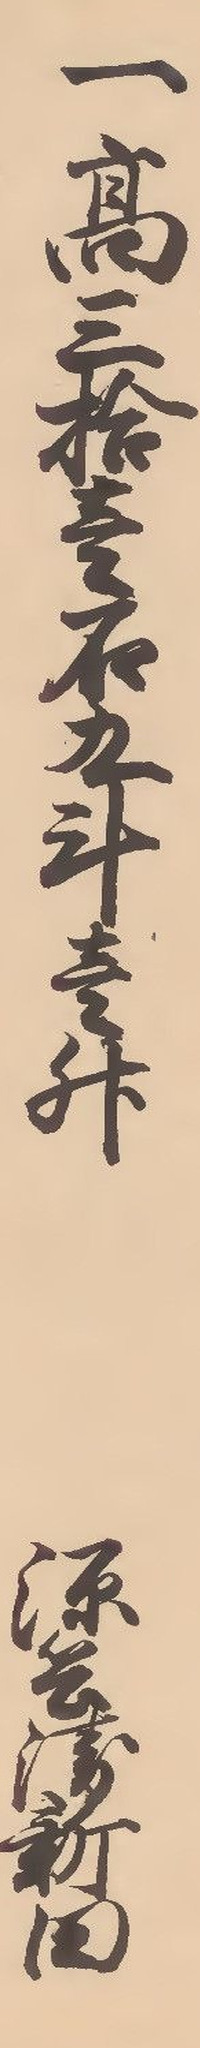一高三拾壱石九斗壱升源兵衛新田
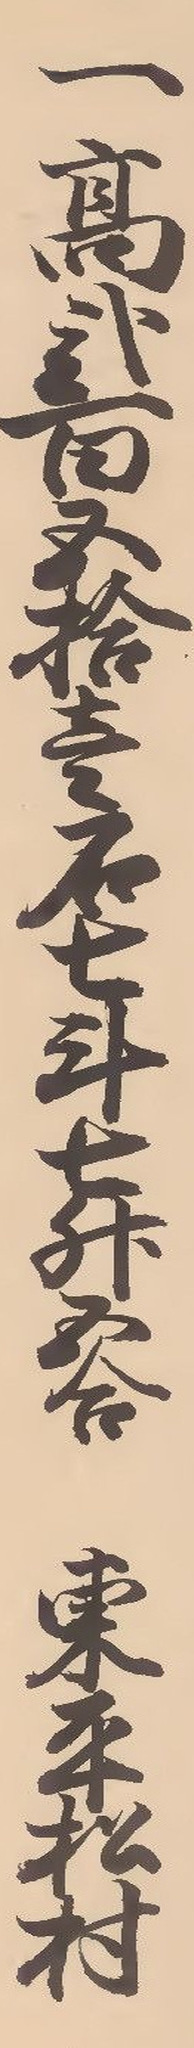一高弐百五拾壱石七斗七升五合東平松村
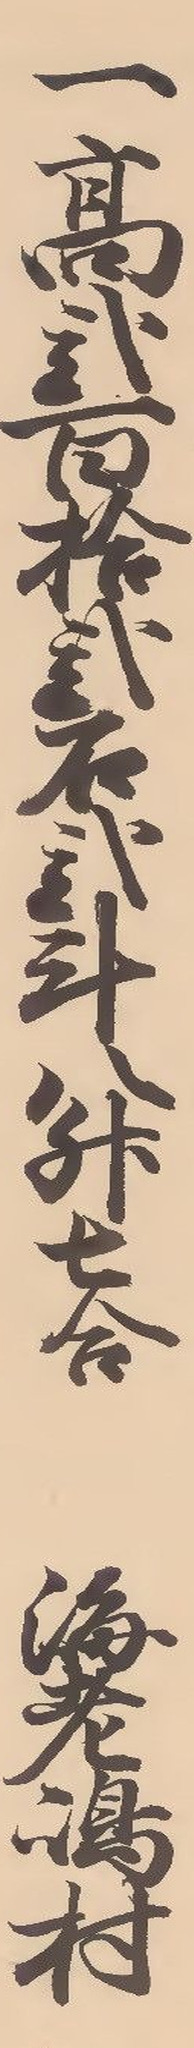一高弐百拾弐石弐斗八升七合海老島村
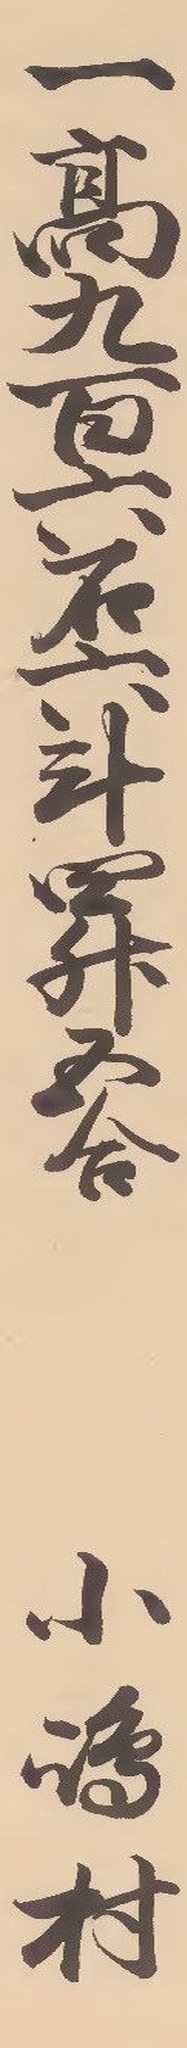一高九百六石六斗四升五合小島村
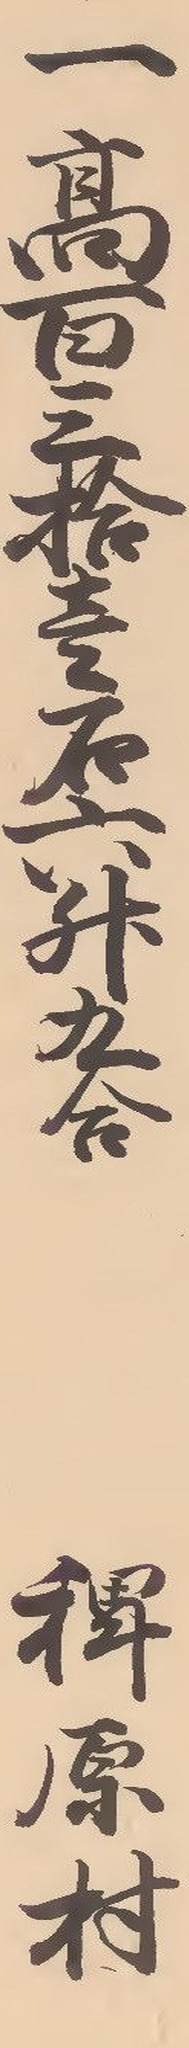一高百三拾壱石六升九合稗原村

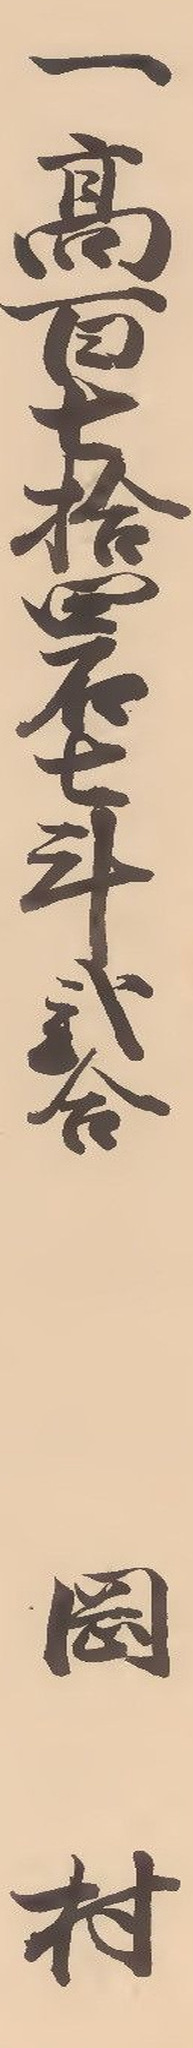一高百七拾四石七斗弐合岡村
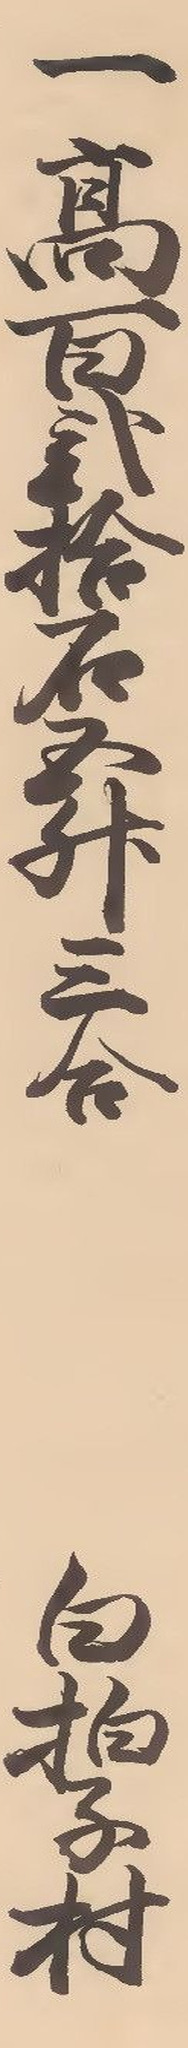一高百弐拾石五升三合白拍子村
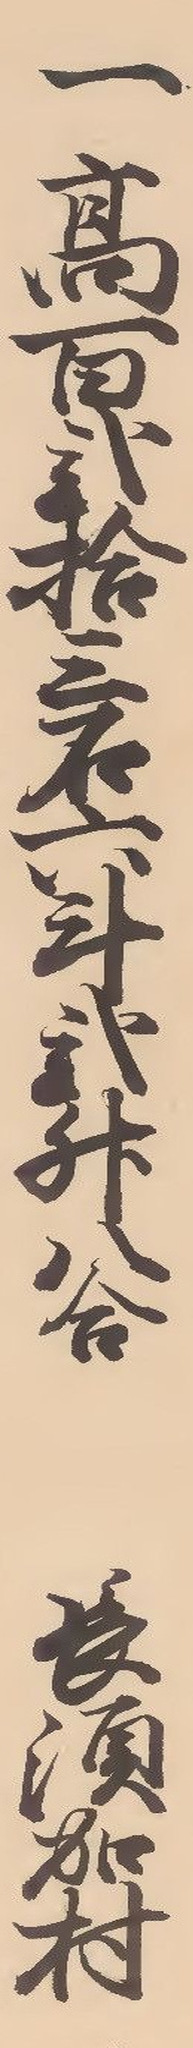一高百弐拾三石六斗弐升八合長須加村
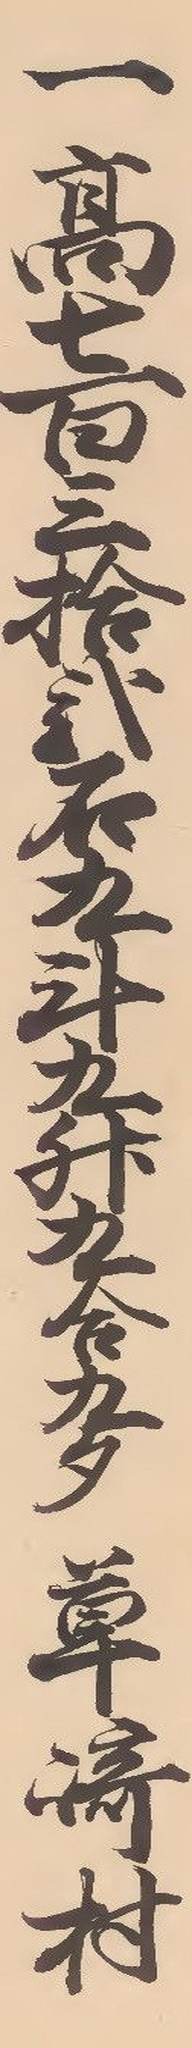一高七百三拾弐石九斗九升九合九勺草崎村
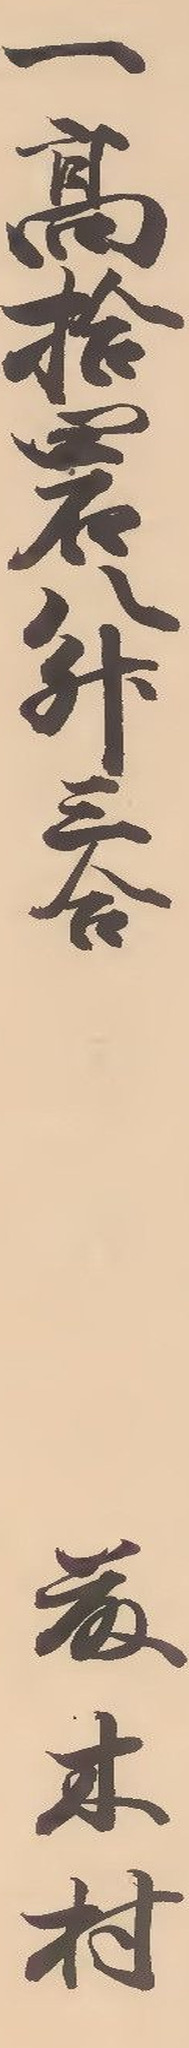一高拾四石八升三合藤木村
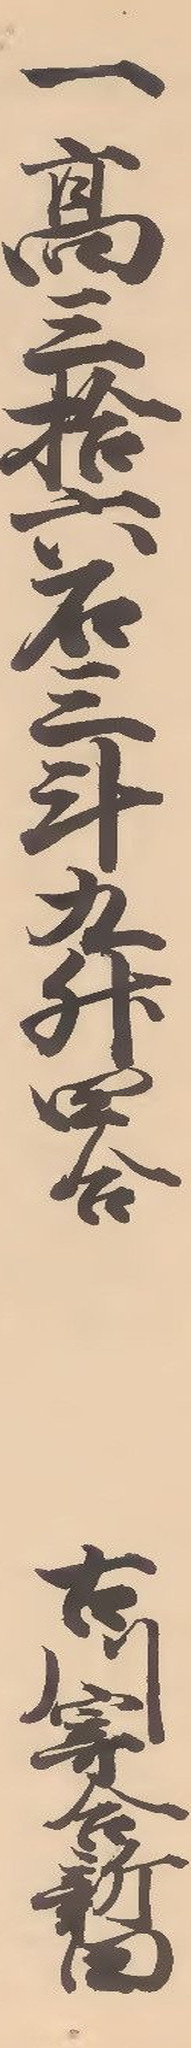一高三拾六石三斗九升四合古川寄合新田
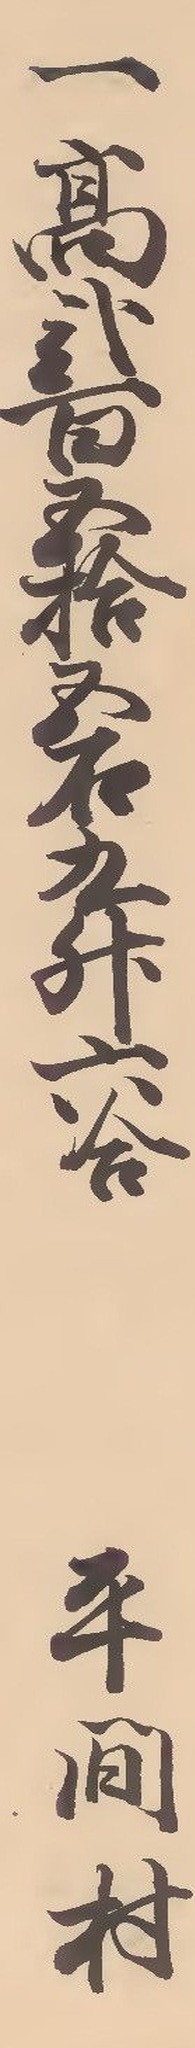一高弐百五拾五石九升六合平間村
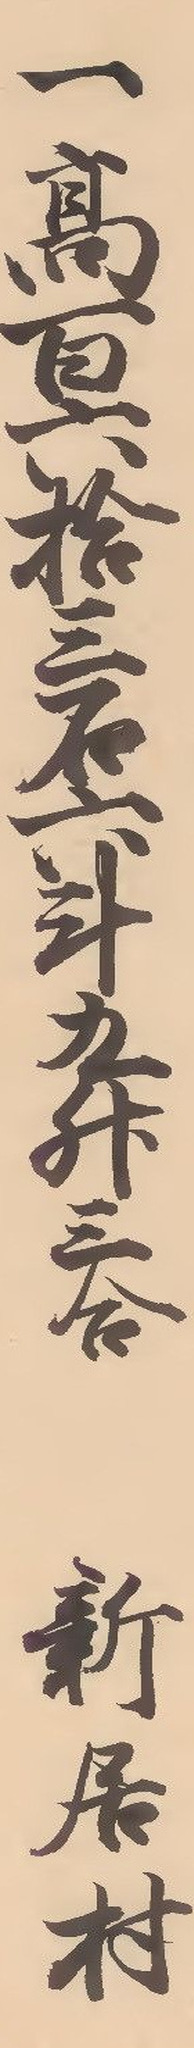一高百六拾三石六斗九升三合新居村

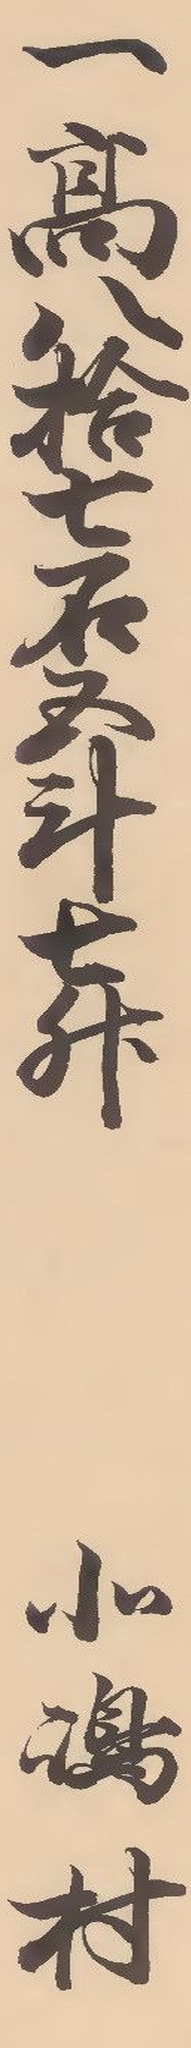一高八拾七石五斗七升北島村
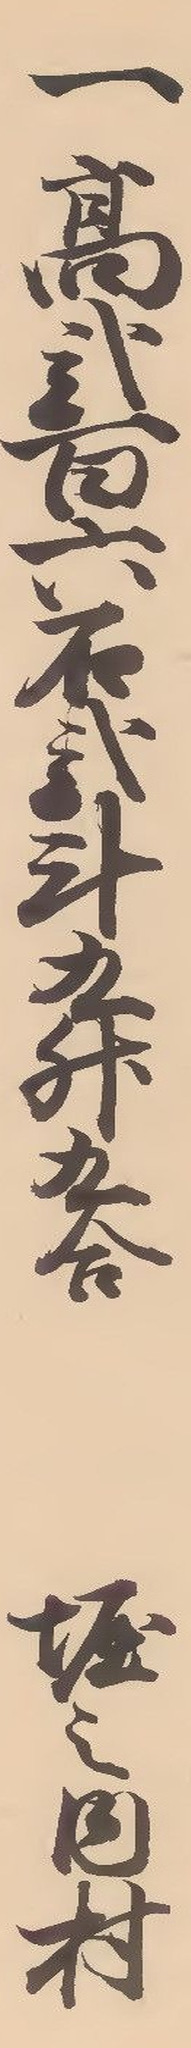一高弐百六石弐斗九升九合堀之内村
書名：遠江国郷帳
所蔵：国立公文書館 National Archives of Japan
